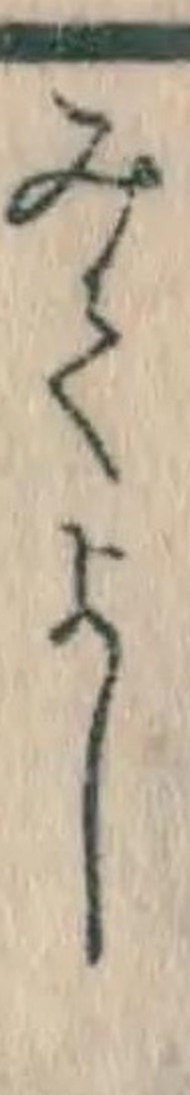みてよし

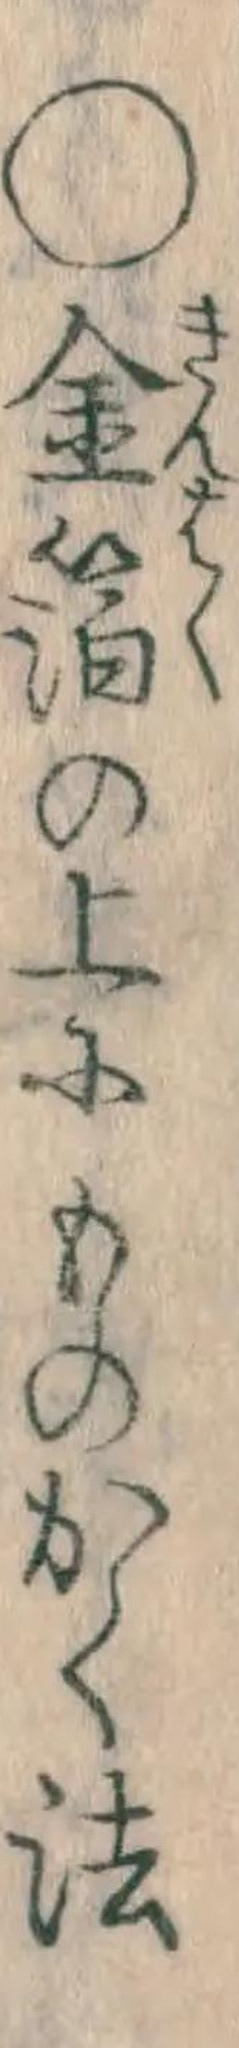○金箔の上にものかく法
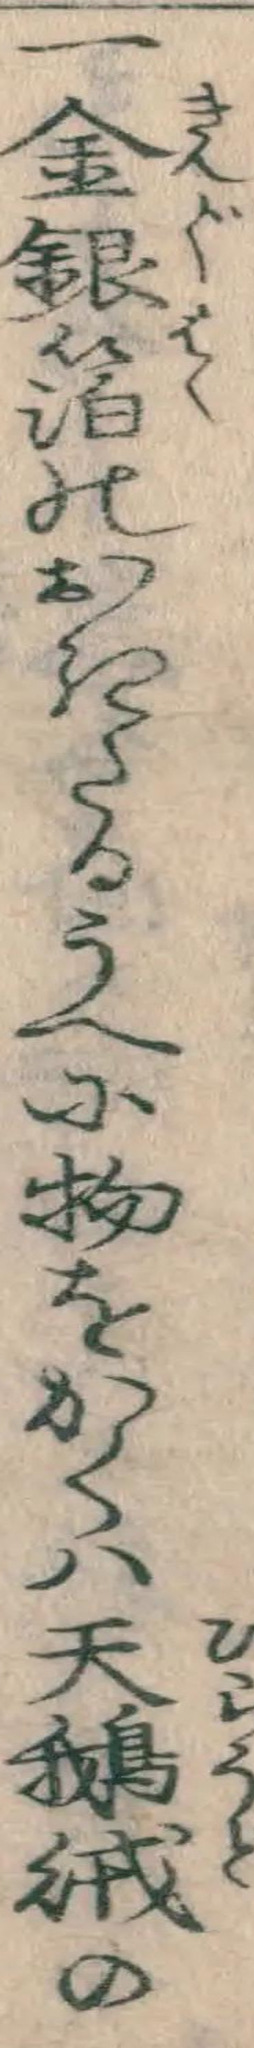一金銀箔のおきたるうへに物をかくは天鵞絨の
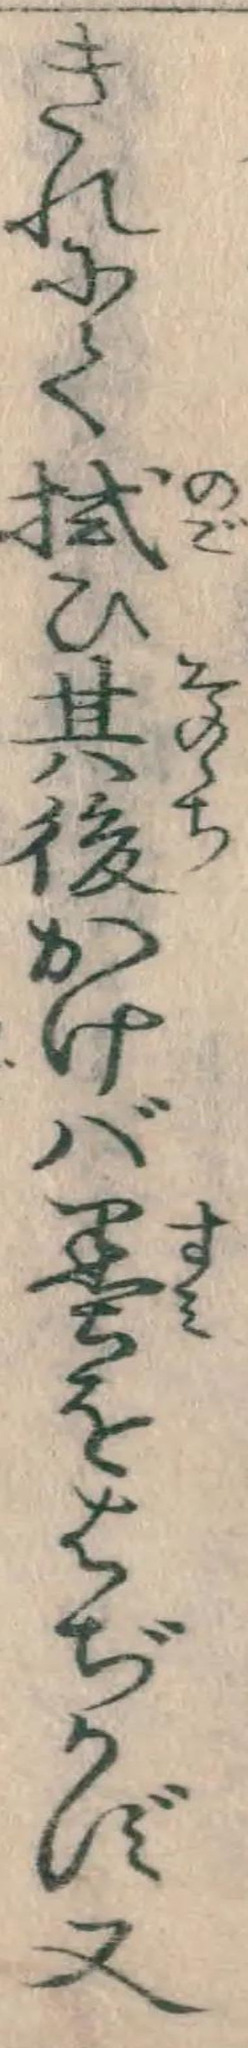きれにて拭ひ其後かけば墨をはぢかず又
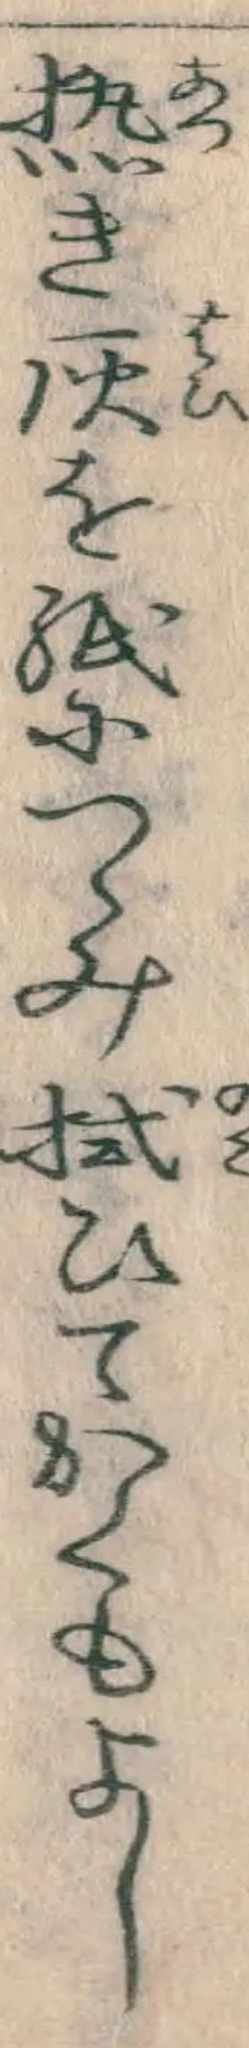熱き灰を紙につゝみ拭ひてかくもよし
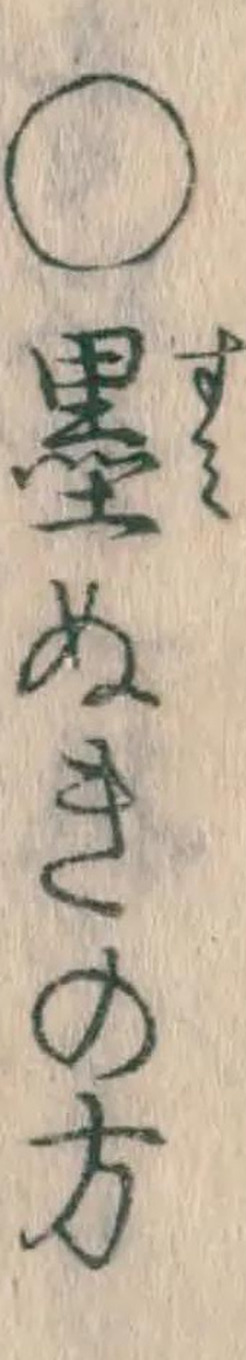○墨ぬきの方
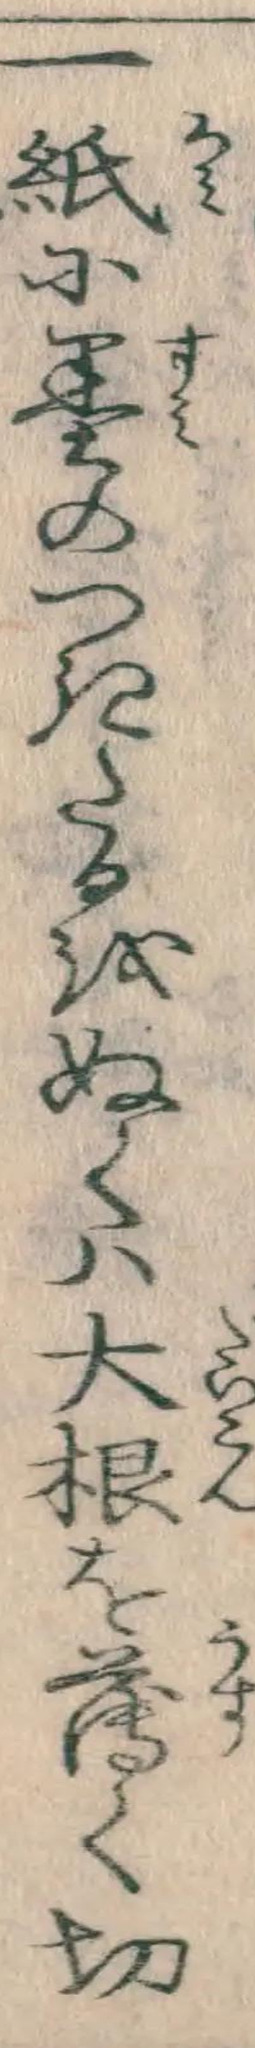一紙に墨のつきたるをぬくは大根を薄く切
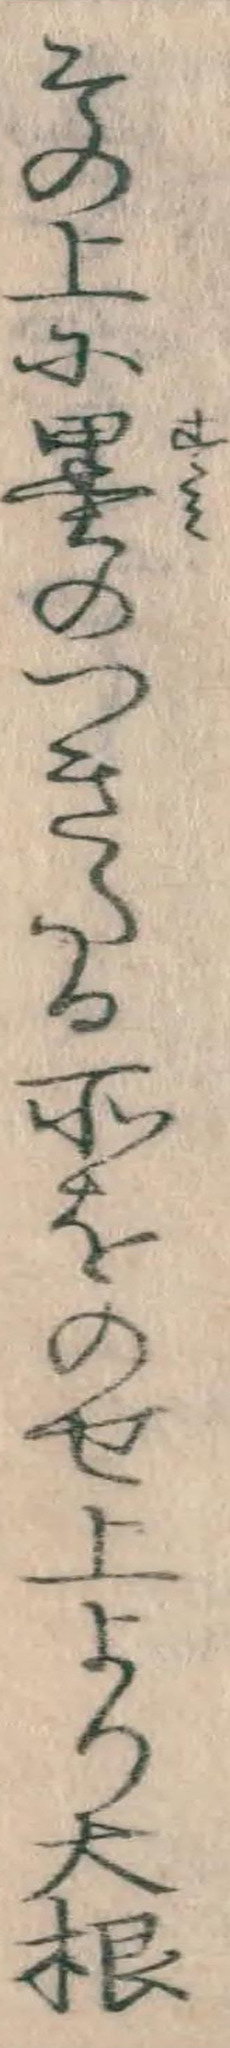その上に墨のつきたる所をのせ上より大根
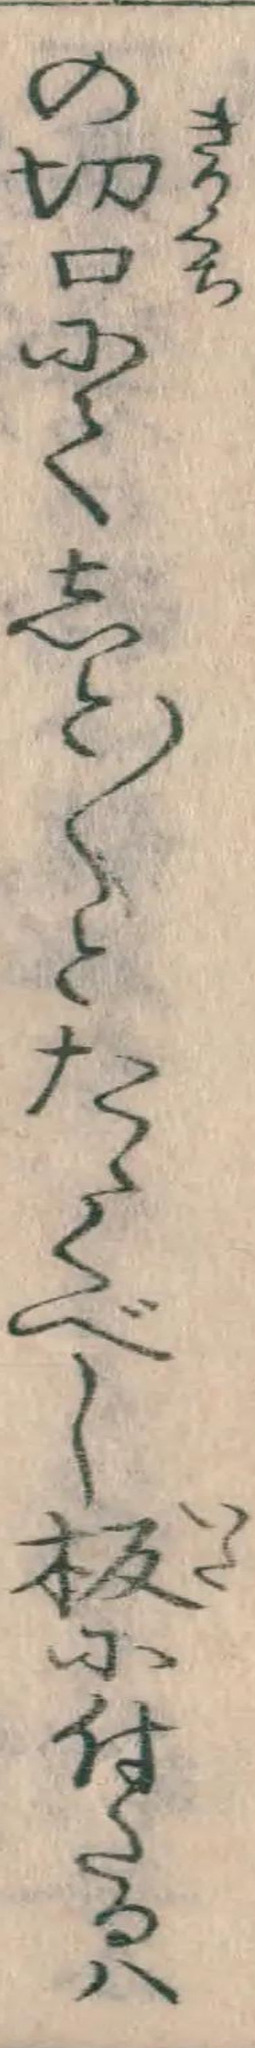の切口にてしと〳〵とたゝくべし板に付たるは
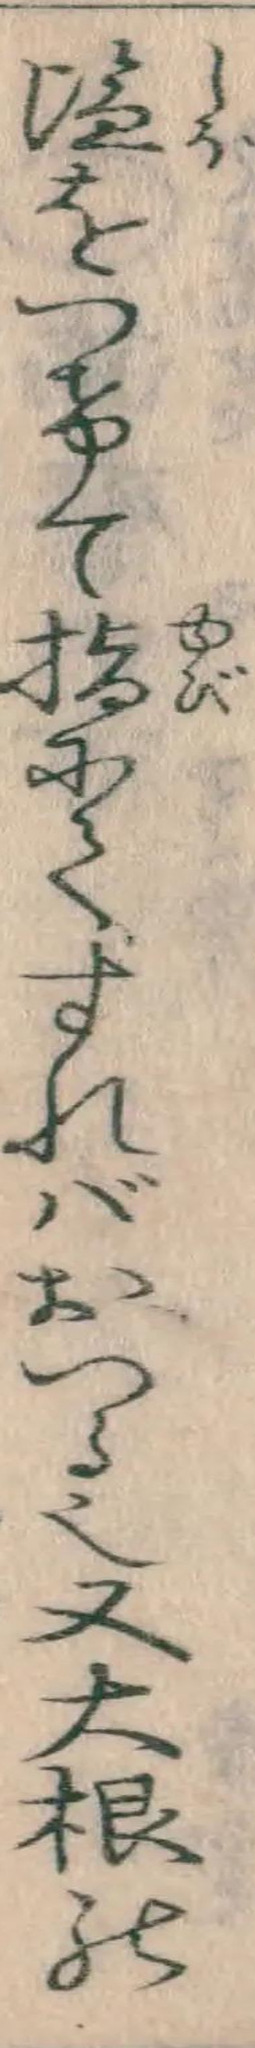塩をつけて指にてすればおつる也又大根の
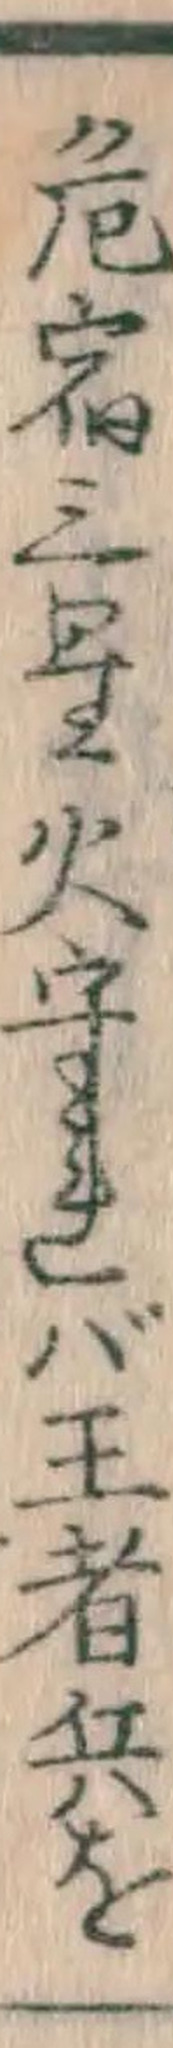危宿三星火守れば王者兵を
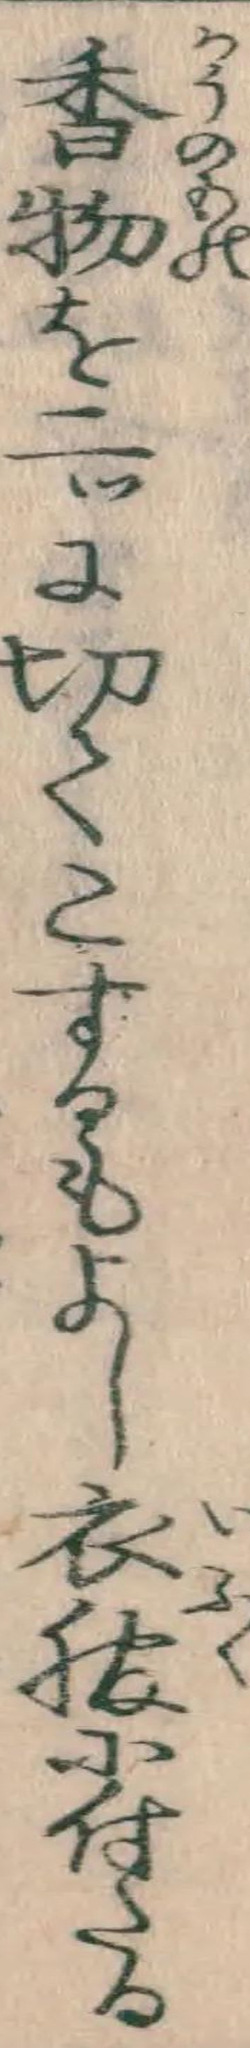香物を二ッに切てこするもよし衣服に付たる
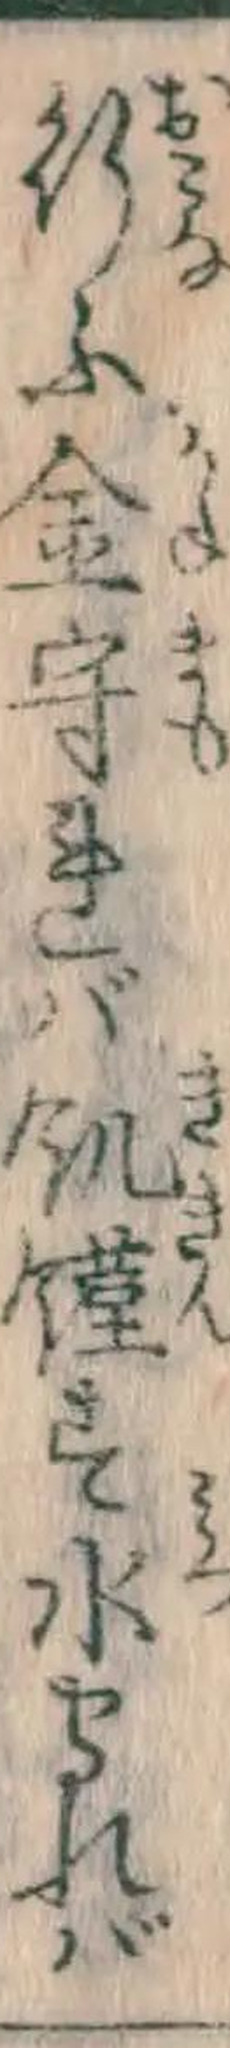行ふ金守れば飢饉す水守れば
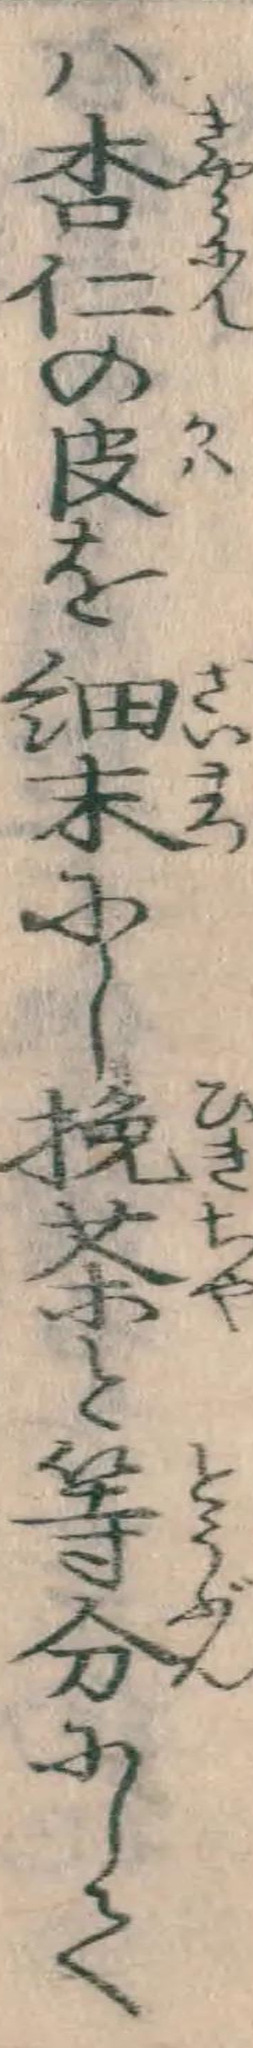は杏仁の皮を細末にし挽茶と等分にして
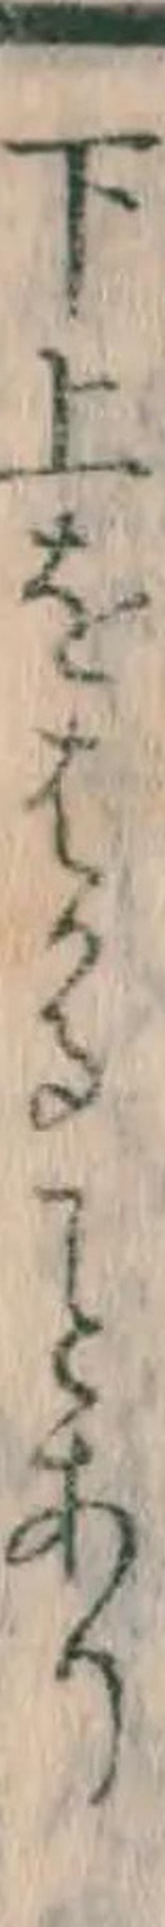下上をはかることあり
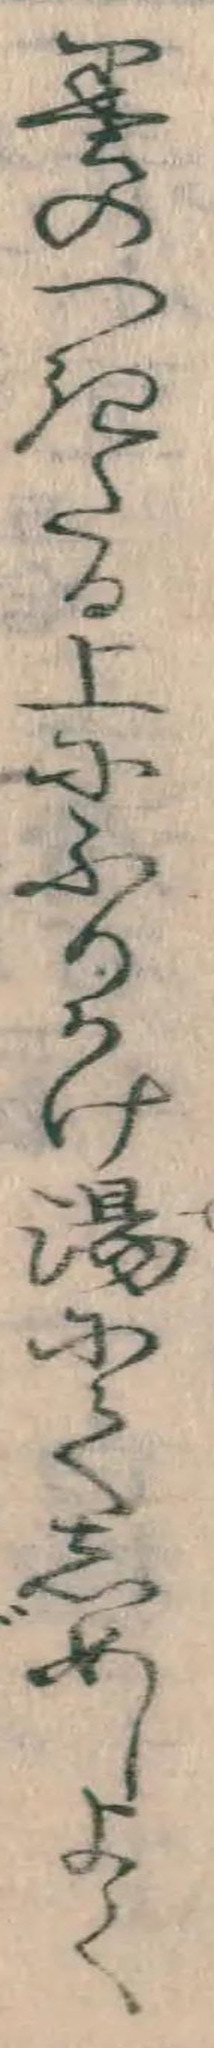墨のつきたる上にふりかけ湯にてしめしよく
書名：広益秘事大全 3巻. [2]
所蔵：国立国会図書館 National Diet Library, JAPAN
